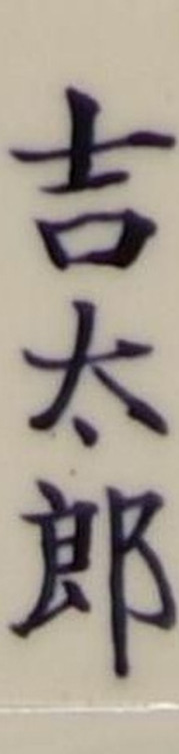吉太郎
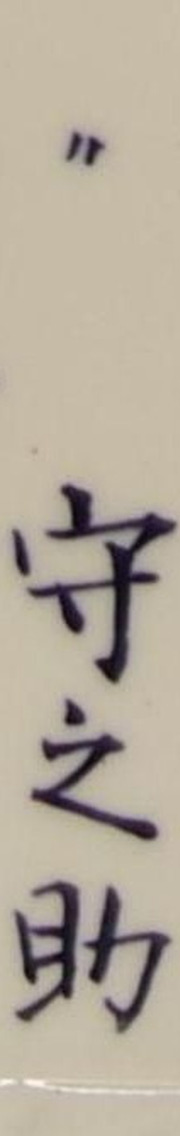守之助
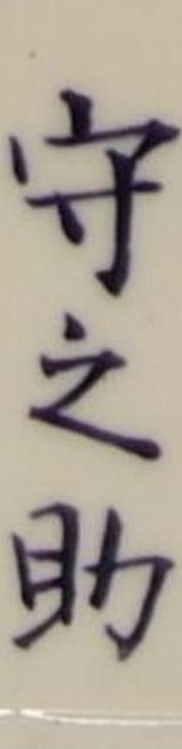守之助
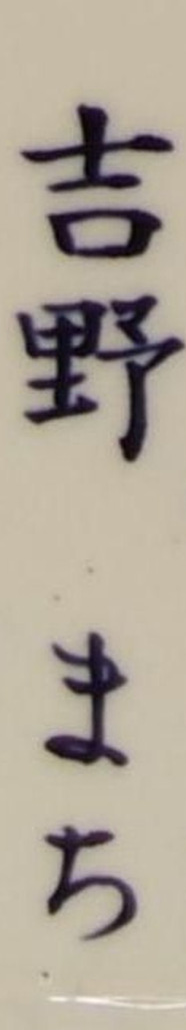吉野まち
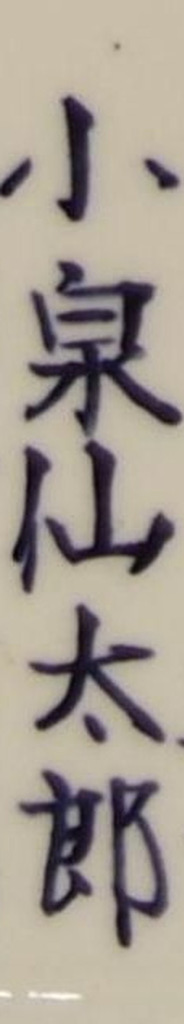小泉仙太郎
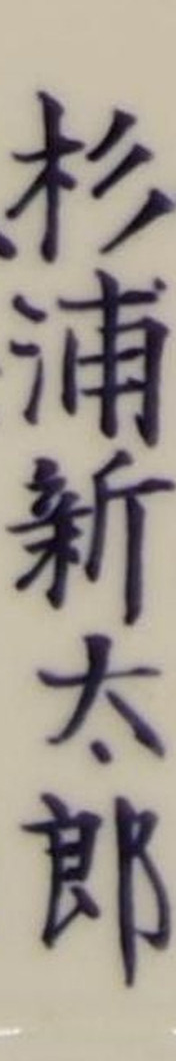杉浦新太郎

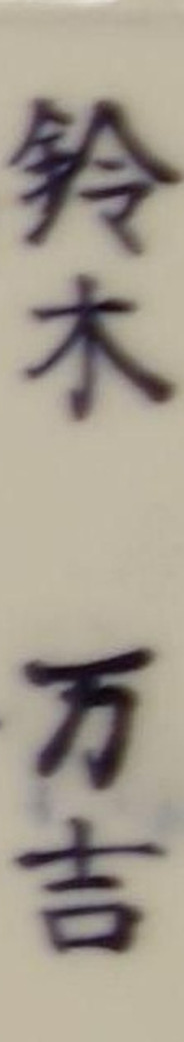鈴木万吉
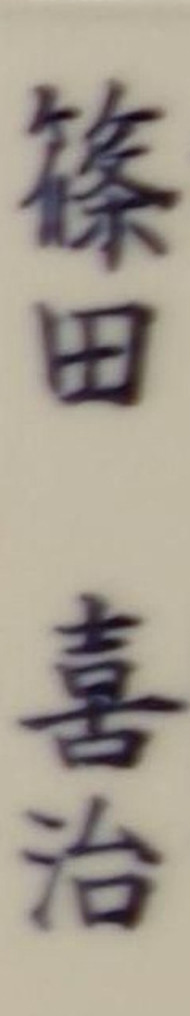篠田喜治
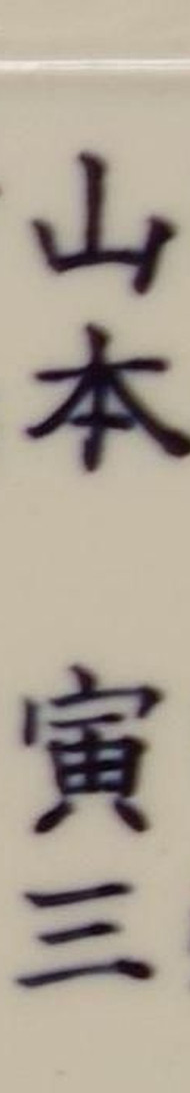山本寅三
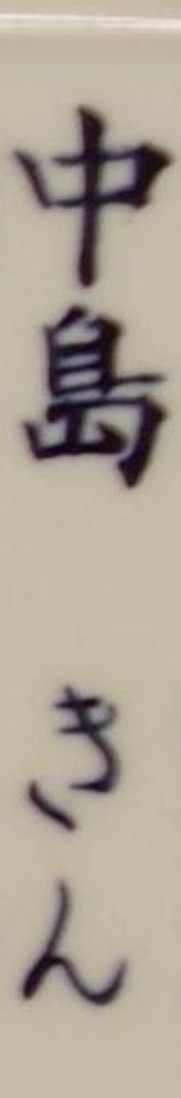中島きん
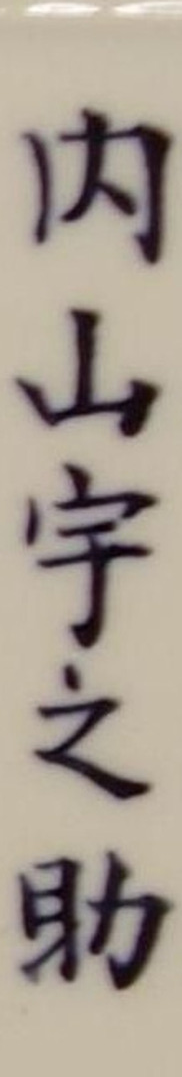内山宇之助
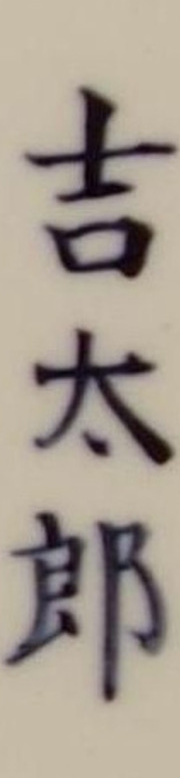吉太郎
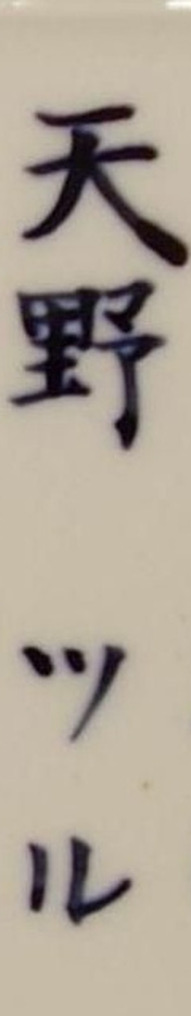天野ツル
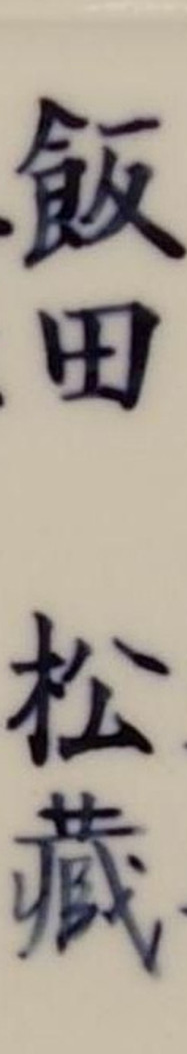飯田松蔵
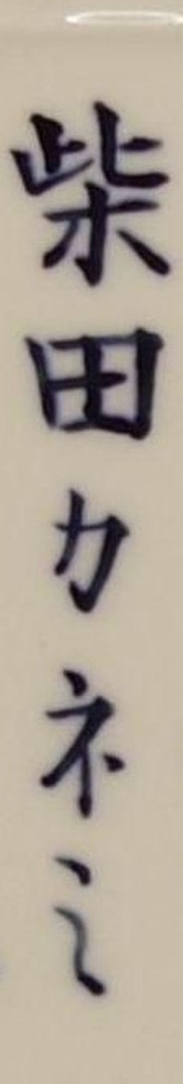柴田カネミ
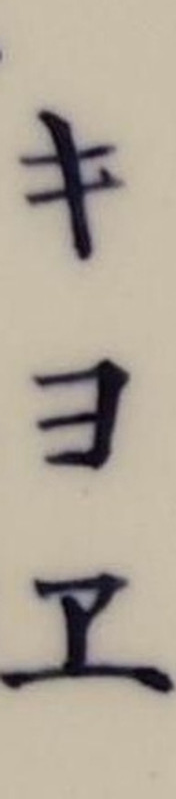キヨエ
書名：E~L
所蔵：高野山金剛峯寺
